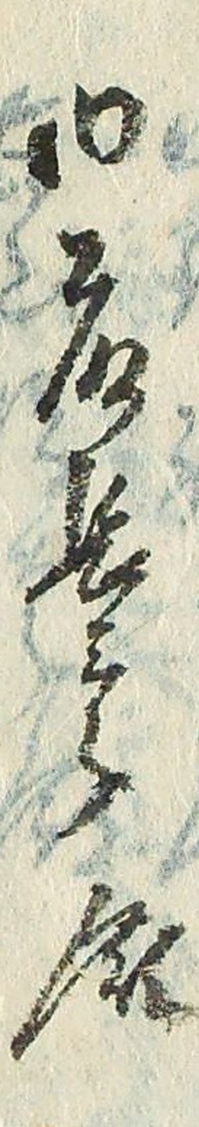内藤長三郎殿
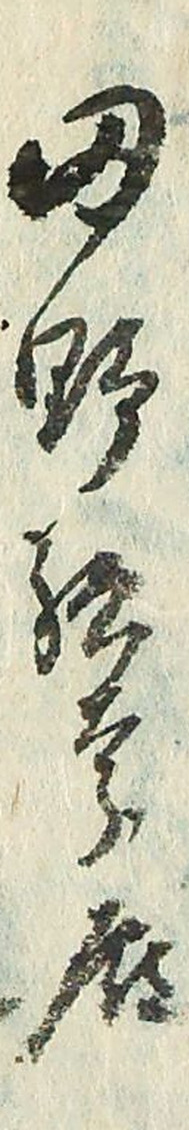田野祐太郎殿
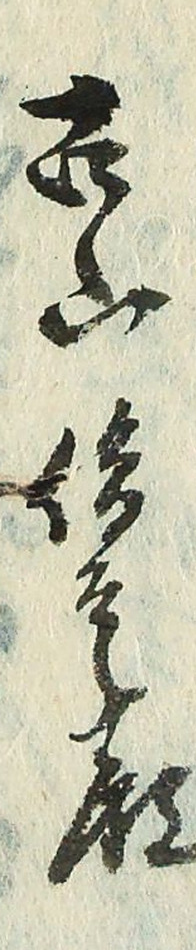古山僧太郎殿
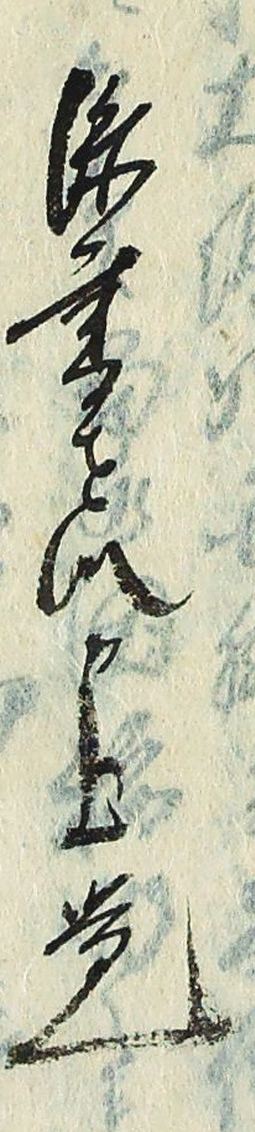添書を以申上覚
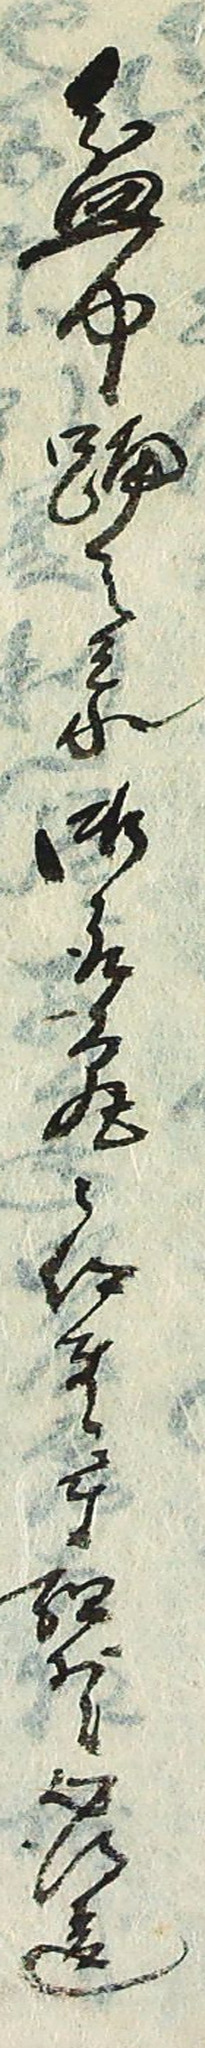盆中踊之義御取究被仰付候に付組村へ心得違
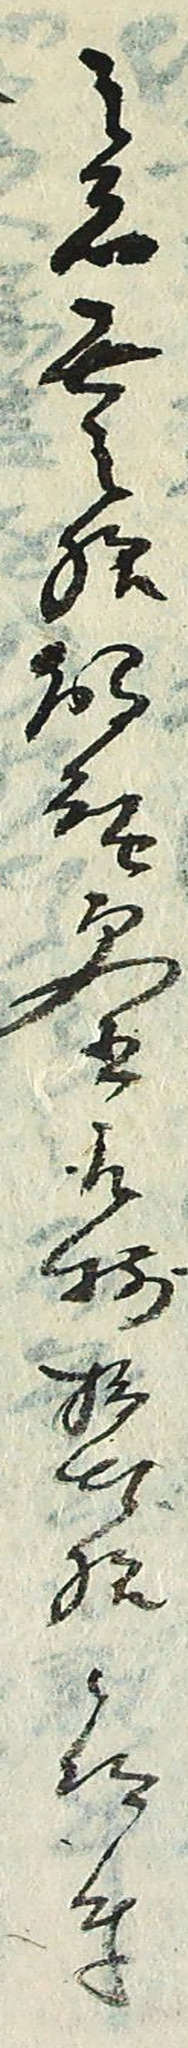之者無之様触知せ受書取揃指出候様被仰付
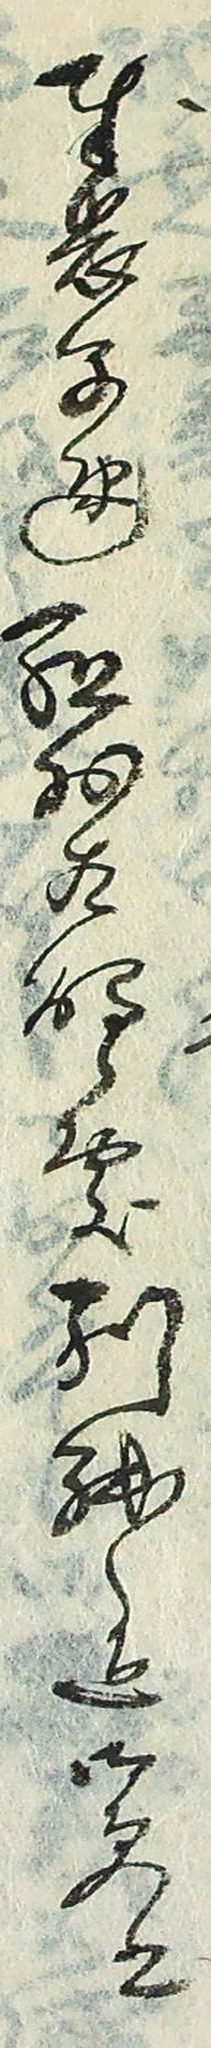奉畏早速組村相触候所別紙之通御受書
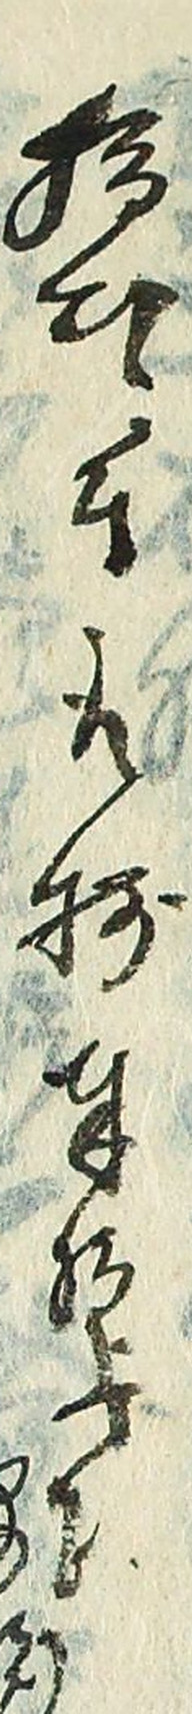指出候に付取揃奉指上候以上
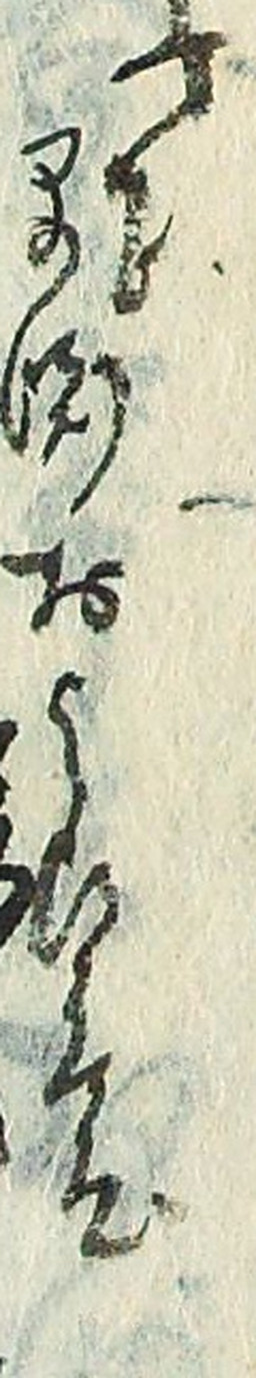早淵村与頭庄屋
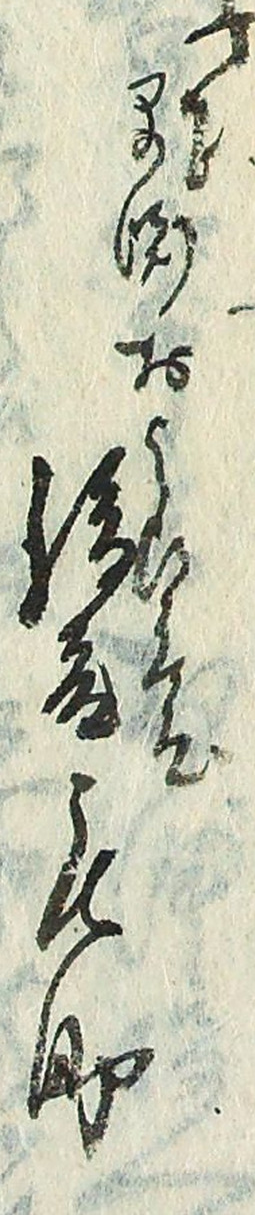後藤庄助
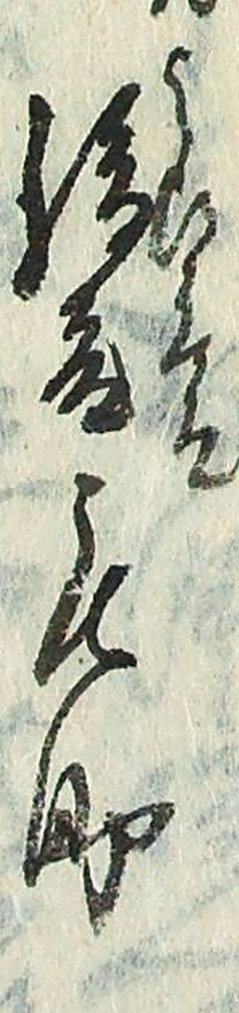後藤庄助
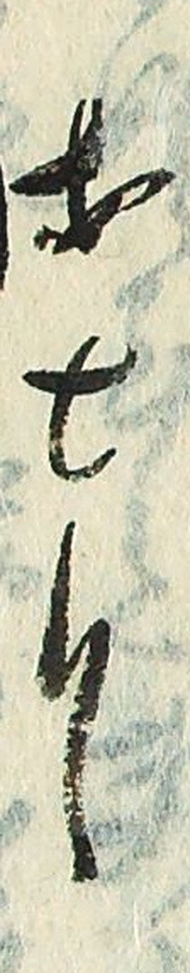戌七月
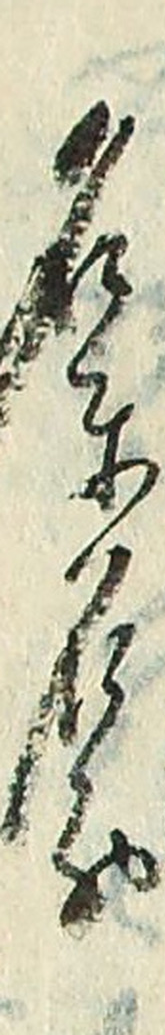名東名西
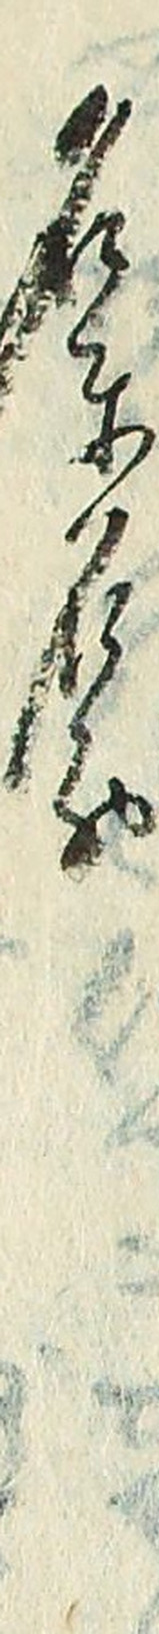名東名西
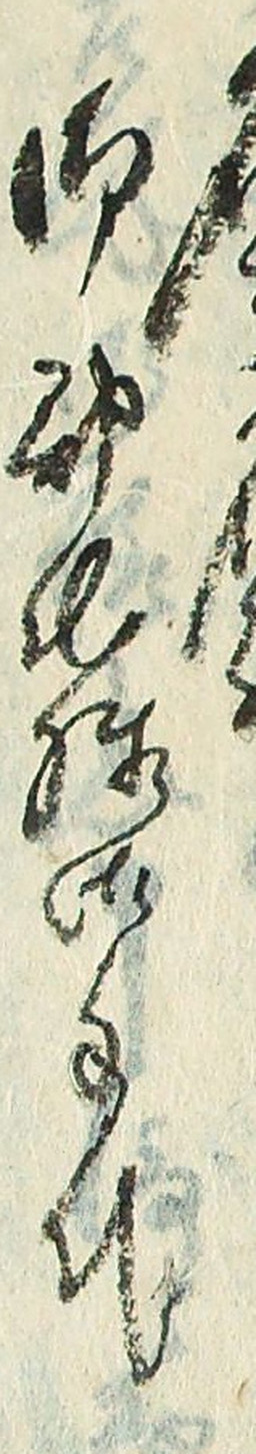御郡代様御手代

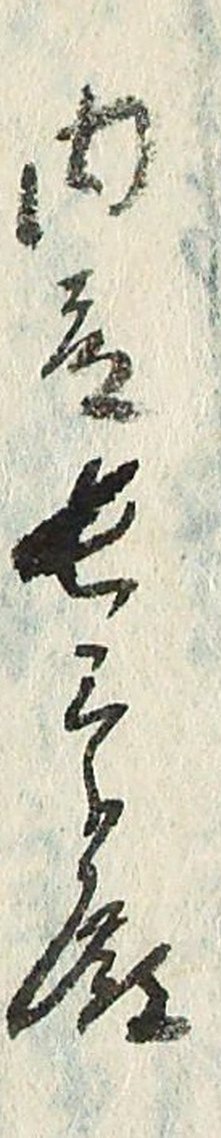内藤長三郎殿
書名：諸御用御□受書控
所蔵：鳴門教育大学 Naruto University of Education
